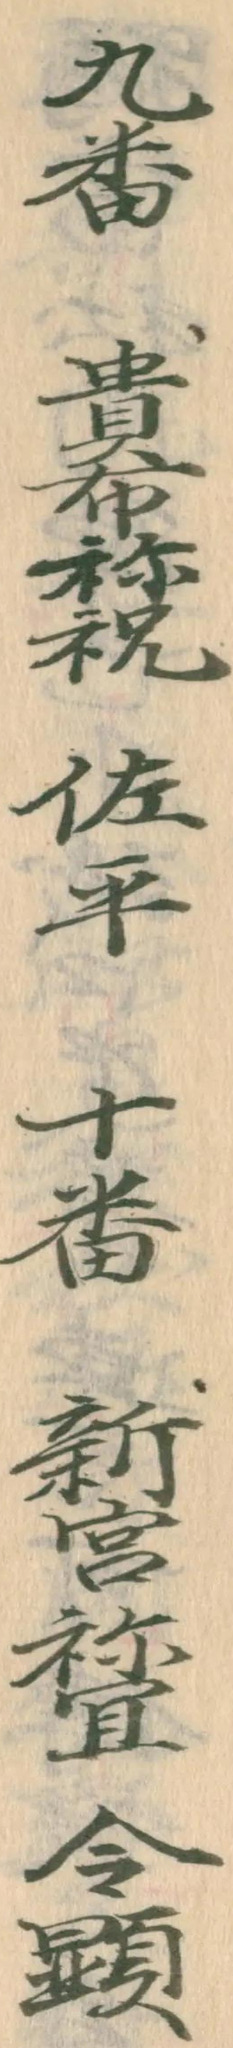九番貴布祢祝佐平十番新宮祢宜令顕
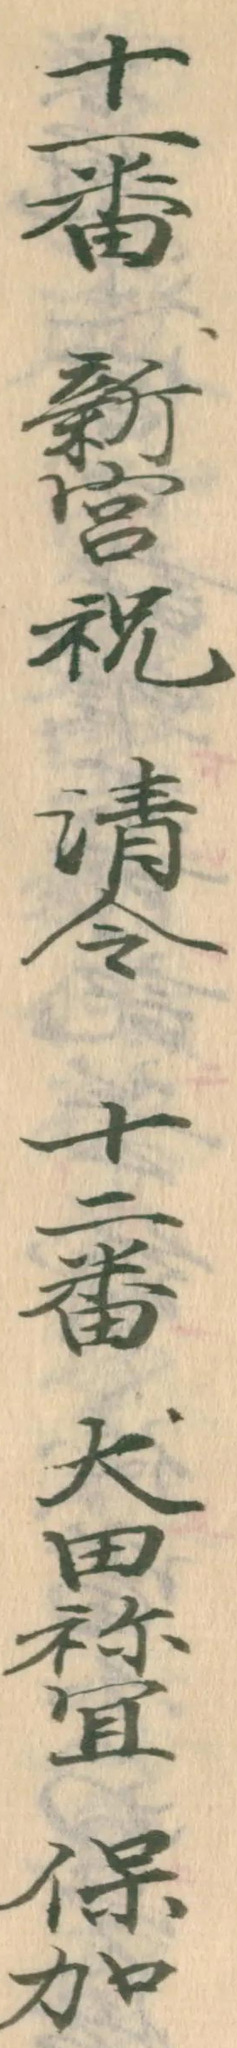十一番新宮祝清令十二番大田祢宜保加
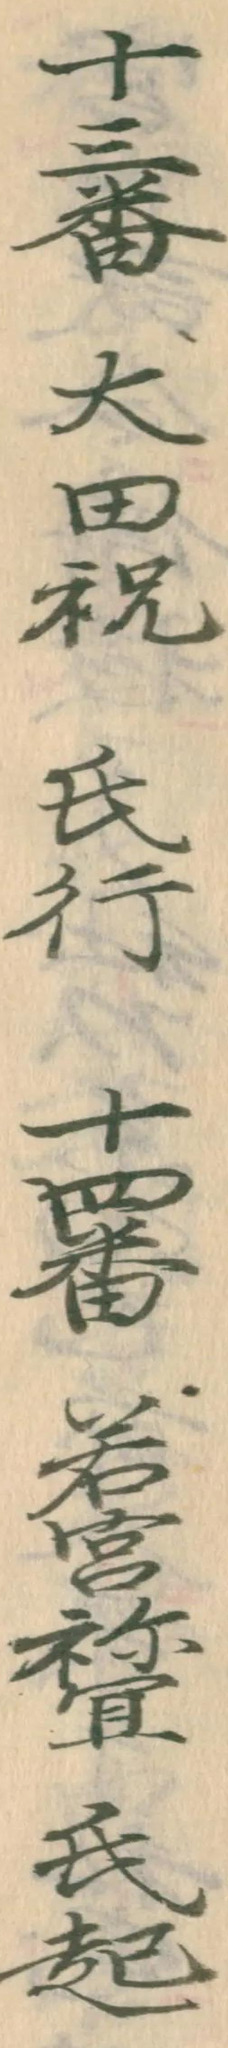十三番大田祝氏行十四番若宮祢宜氏起
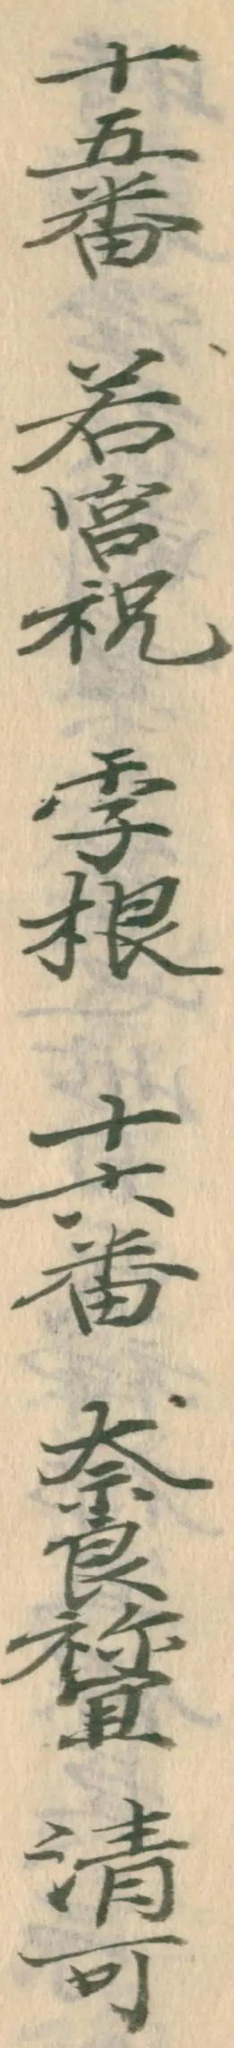十五番若宮祝季根十六番奈良祢宜清可
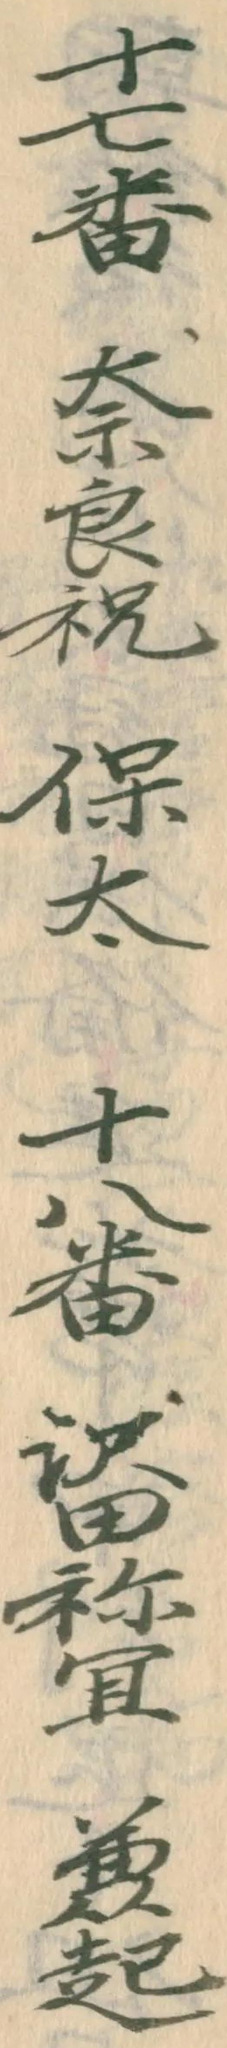十七番奈良祝保太十八番沢田祢宜兼起
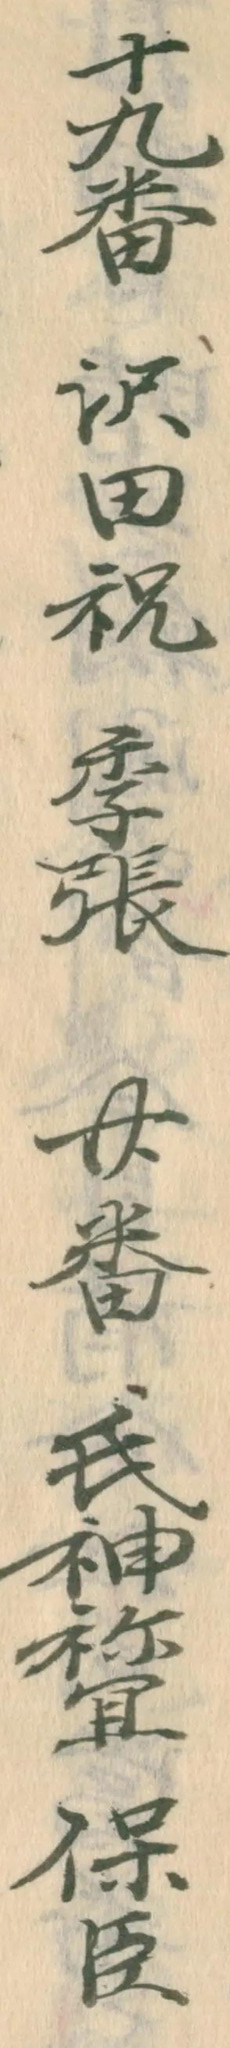十九番沢田祝季張廿番氏神祢宜保臣
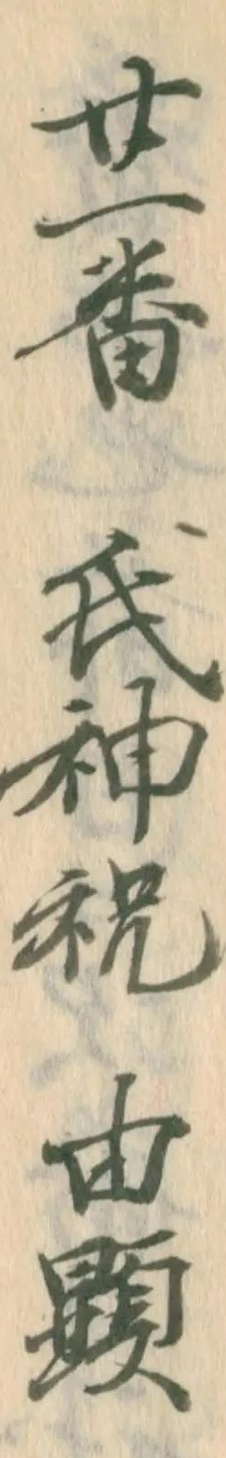廿一番氏神祝由顕
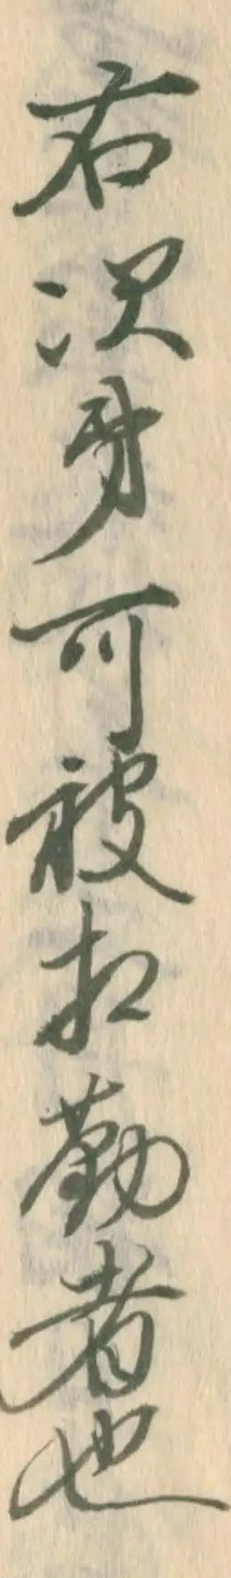右次第可被相勤者也
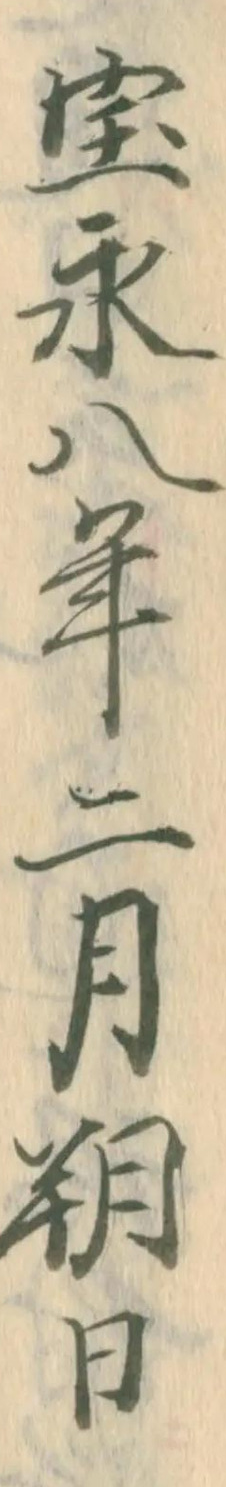宝永八年二月朔日

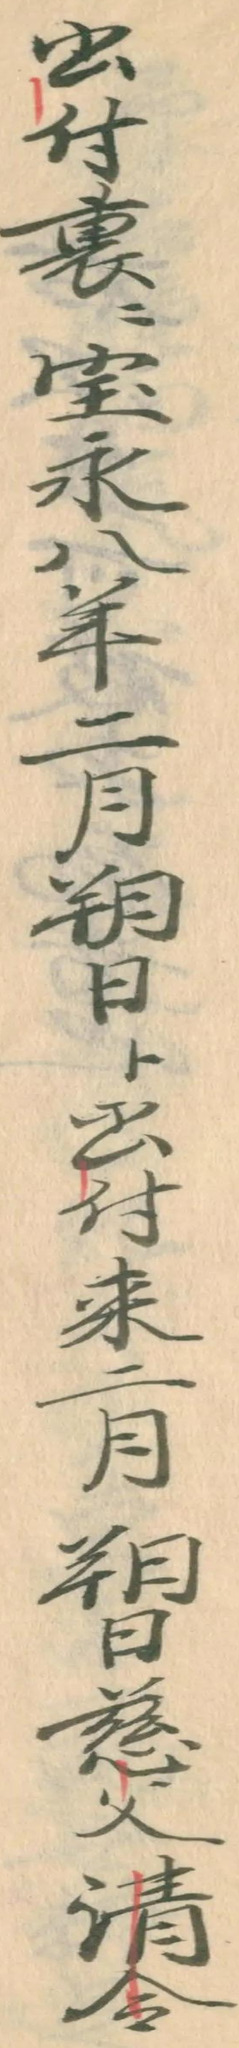書_付裏ニ宝永八年二月朔日ト書_付来二月朔日慈-父清令
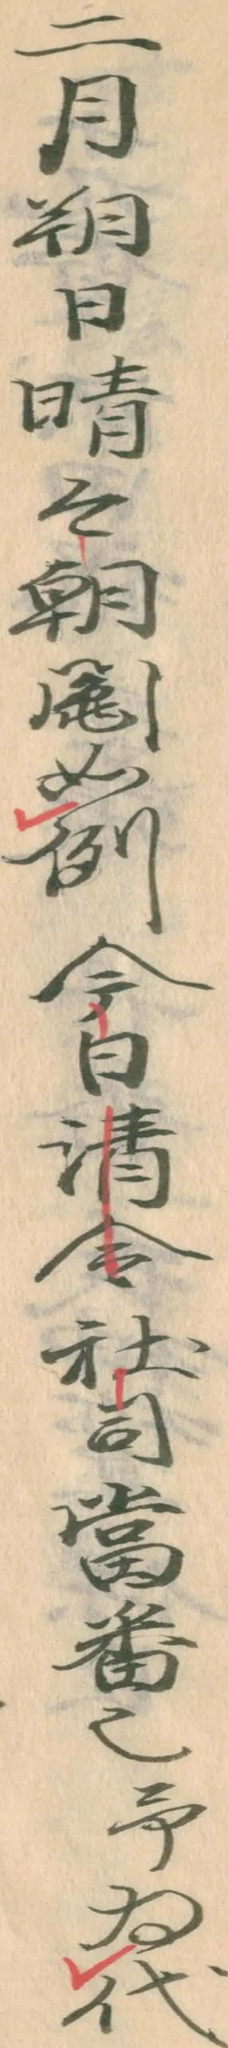二月朔日晴今-朝鬮如例今-日清令社-司当番也予為代
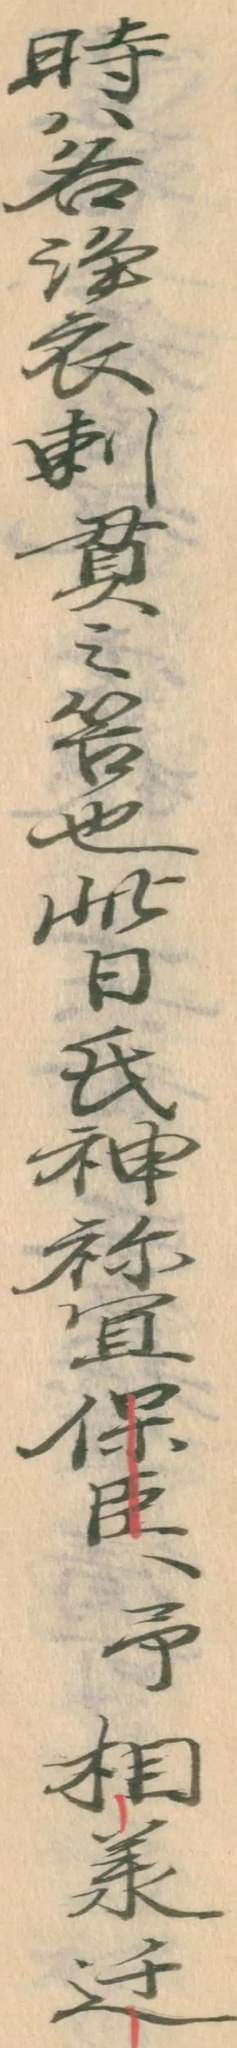時ハ各浄衣刺貫之筈也此日氏神祢宜保臣ヘ予相-承迁-
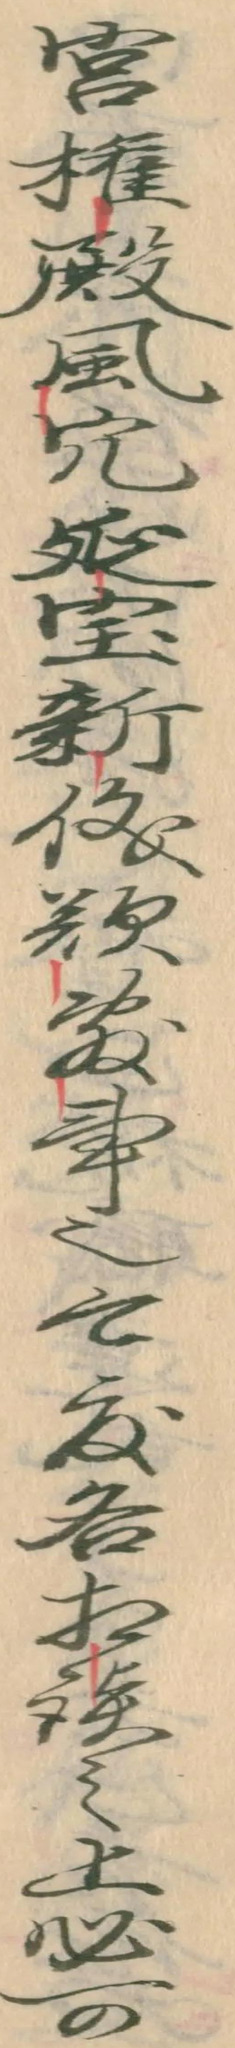宮権-殿風_穴延-宝新-儀歎_敷_事也今度各相-談之上必可
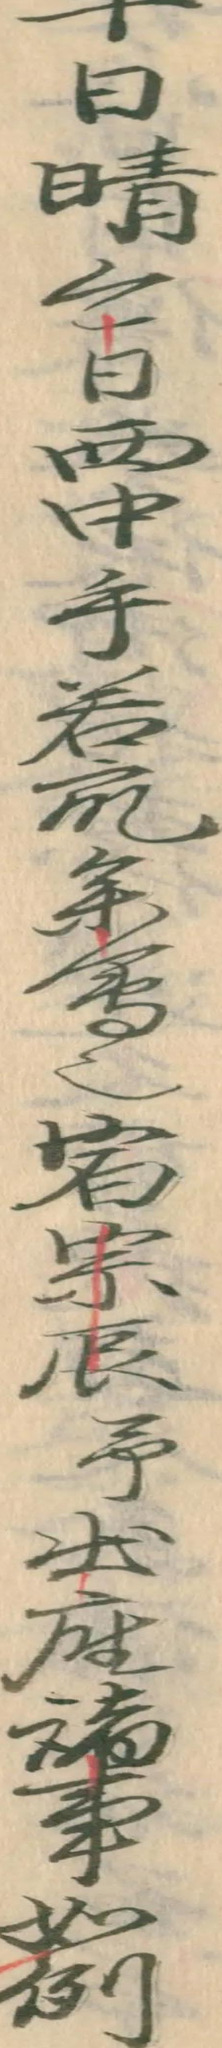十日晴今-日西中手若衆参-会也宿宗辰予出-座諸-事如例
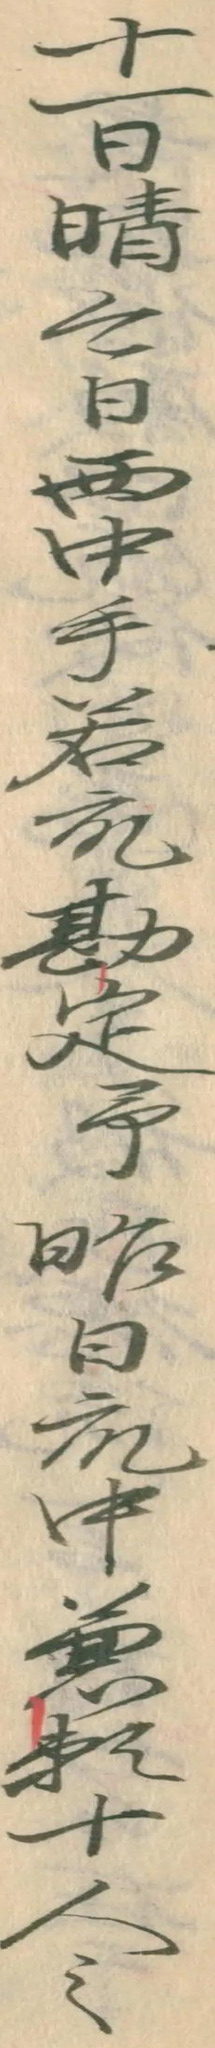十一日晴今日西中手若衆勘-定予昨日衆中兼_頼十人之

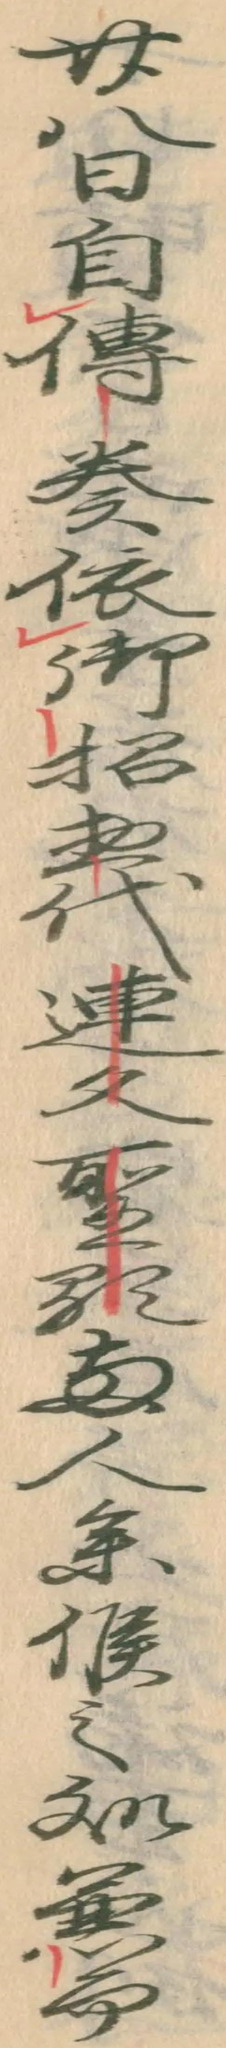廿八日自伝-奏依御_招惣-代連久聖顕両人参候之処兼_而
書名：賀茂社記録. 第15冊
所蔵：国立国会図書館 National Diet Library, JAPAN
